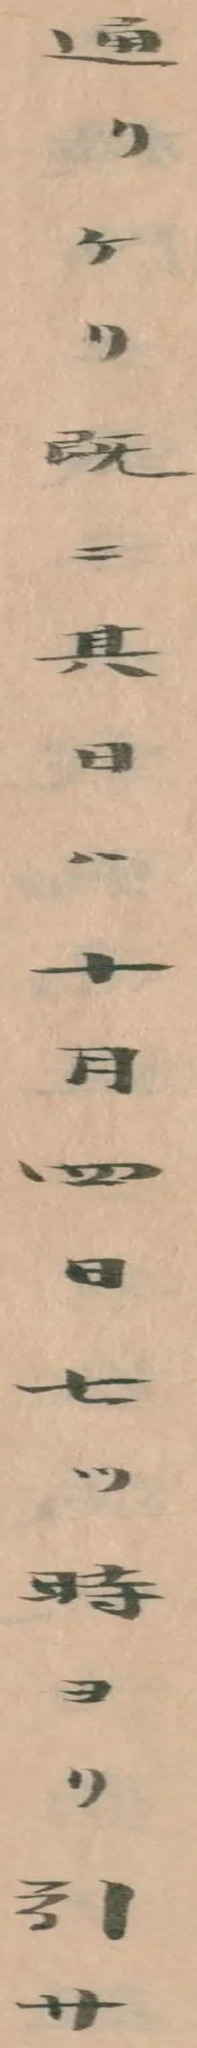通リケリ既二其日ハ十月四日七ッ時ヨリ引サ
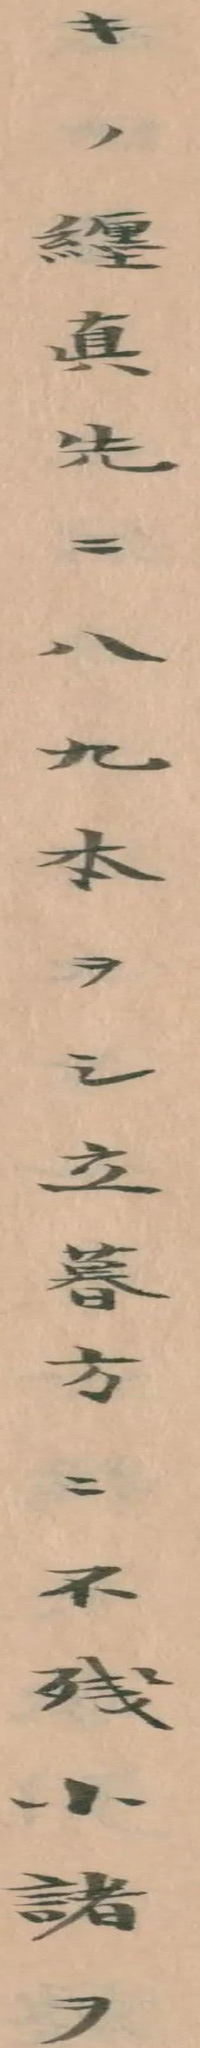キノ纏真先二八九本ヲレ立暮方二不残小諸ヲ
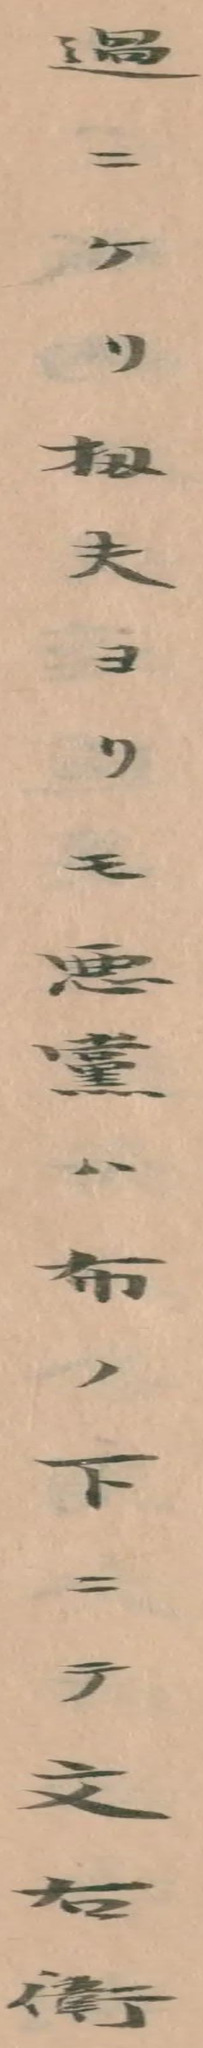過二ケリ扨夫ヨリモ悪党ハ布ノ下二テ文右衛
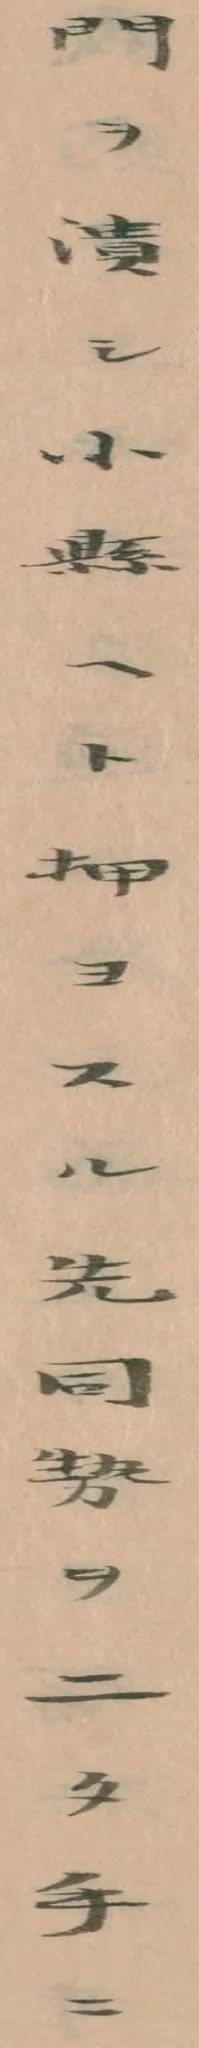門ヲ潰シ小県ヘト押ヨスル先同勢ヲ二タ手二
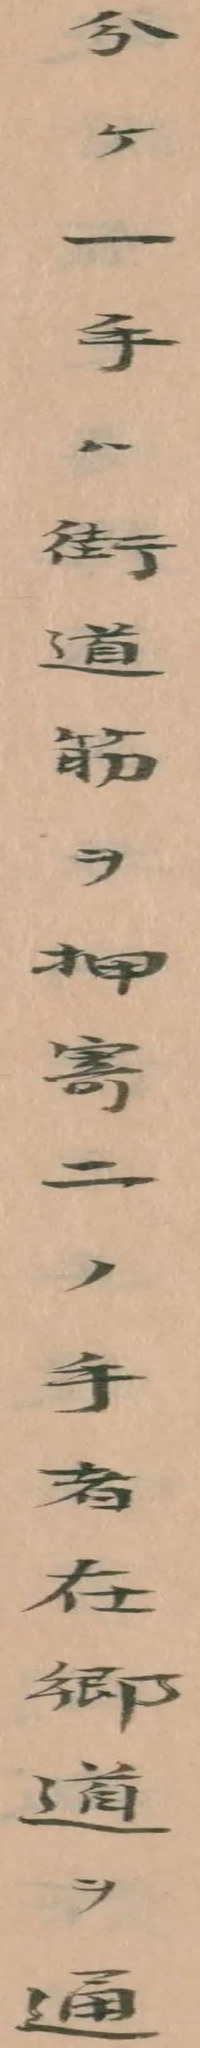分ヶ一手ハ街道筋ヲ押寄二ノ手者在郷道ヲ通
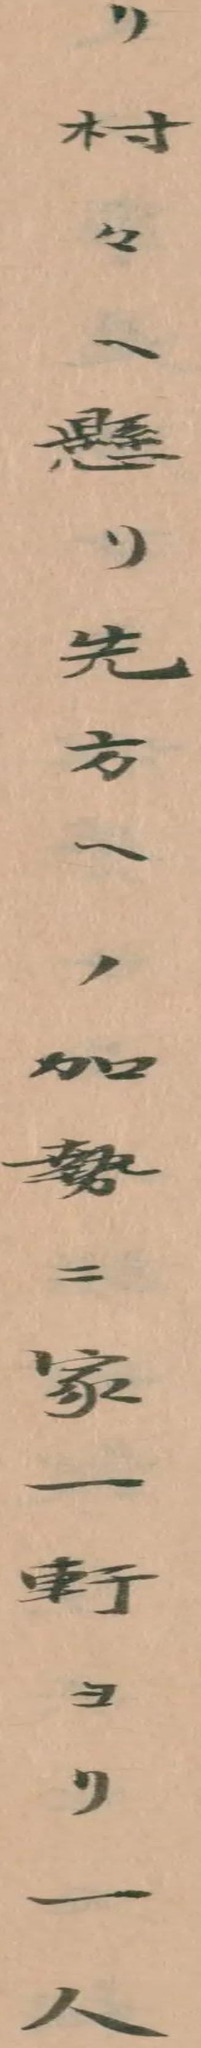り村々へ懸り先方ヘノ加勢二家一軒ヨリ一人
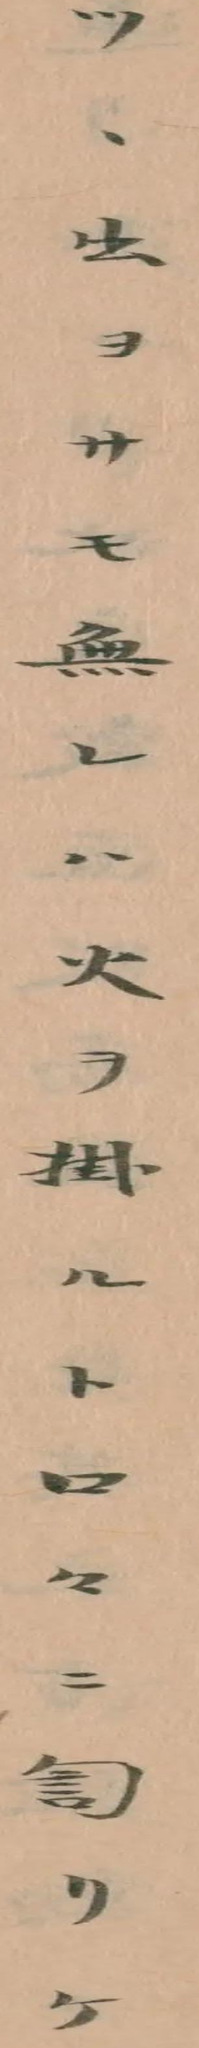ツゝ出ヨサモ無レハ火ヲ掛ㇽト口々二訇りヶ
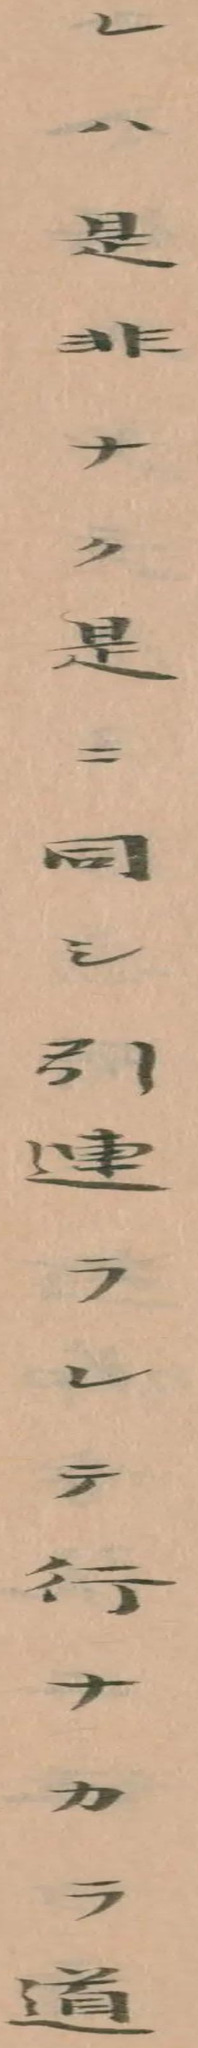レハ是非ナク是二同シ引連ラレテ行ナカラ道
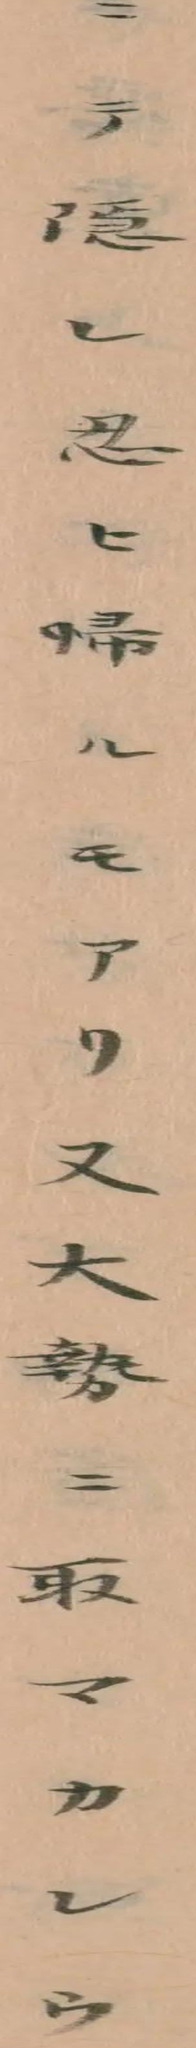ニテ隠レ忍ヒ帰ルモアリ又大勢二取マカレウ
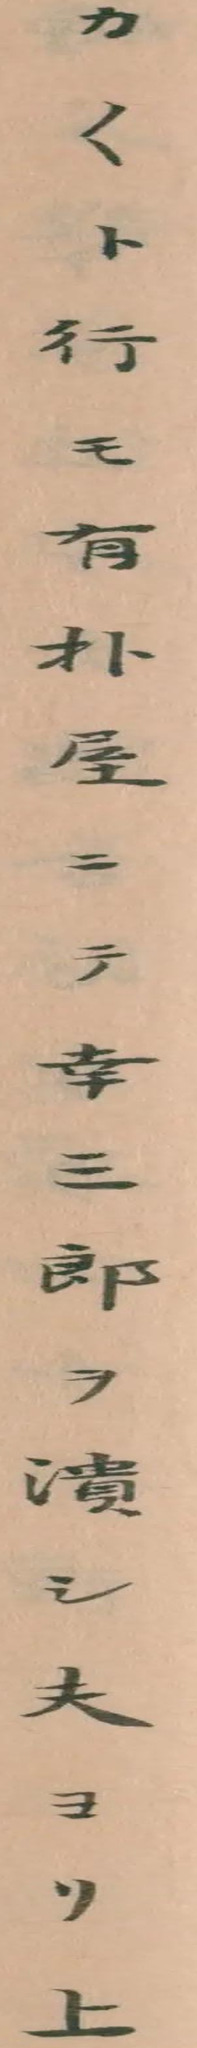カ〳〵ト行モ有朴屋ニテ幸三郎ヲ潰シ夫ヨリ上
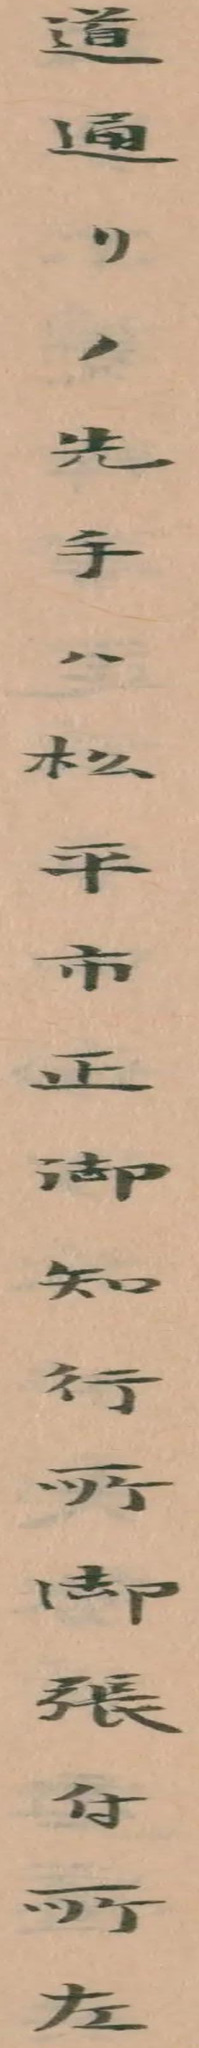道通リノ先手ハ松平市正御地行所御張付所左
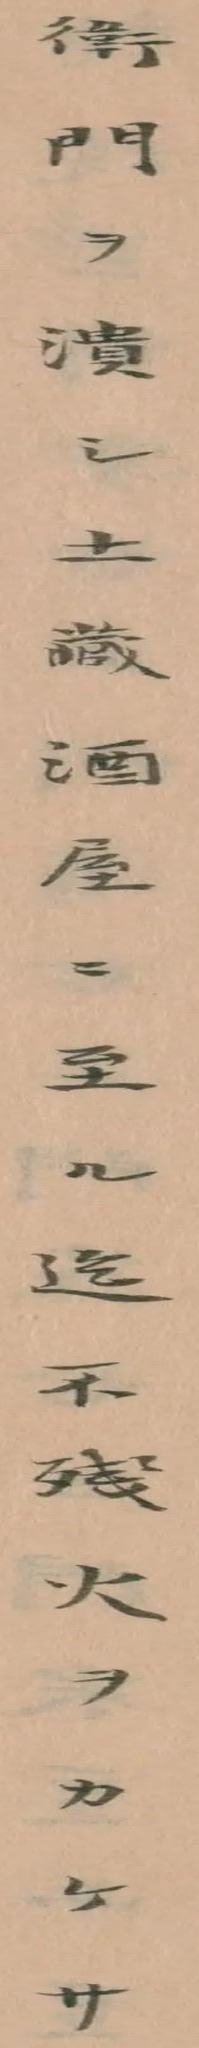衛門ヲ潰シ土蔵酒屋二至ル迄不残火ヲカケサ
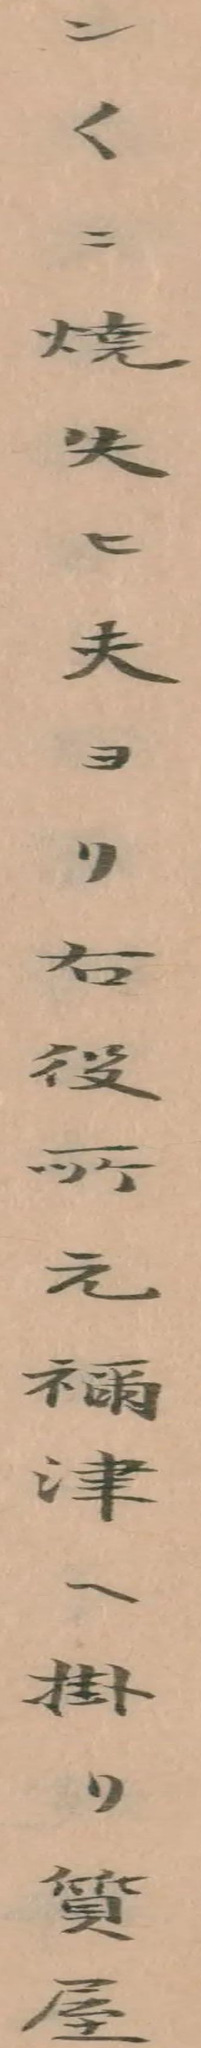ン〳〵二焼失二夫ヨリ右役所元禰津ヘ掛り質屋
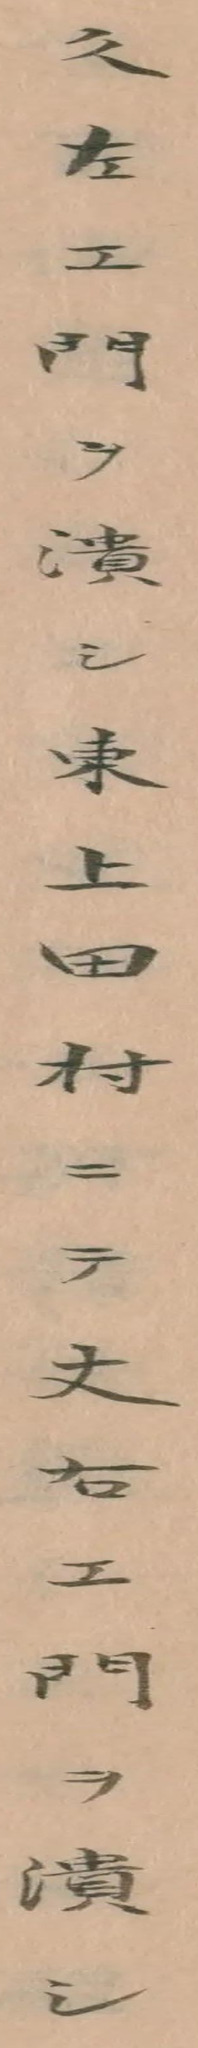久左衛門ヲ潰シ東上田村ニテ丈右衛門ヲ潰シ
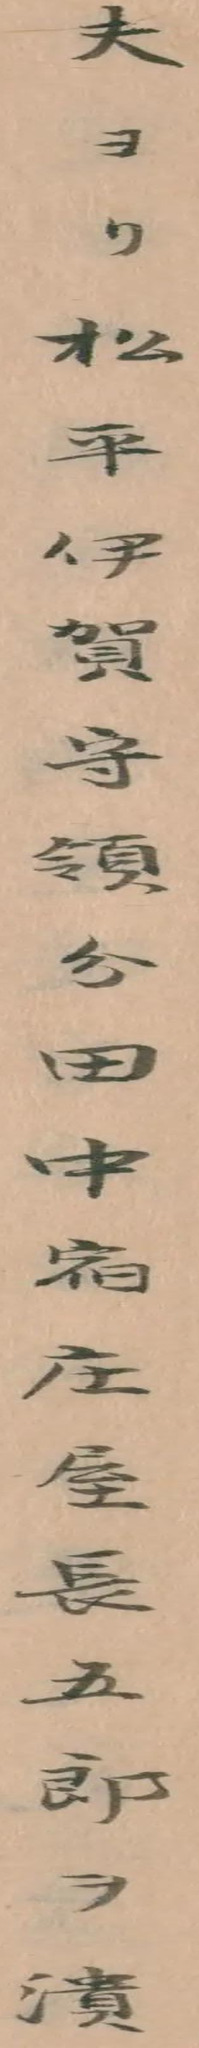夫ヨリ松平伊賀守領分田中宿庄屋長五郎ヲ潰
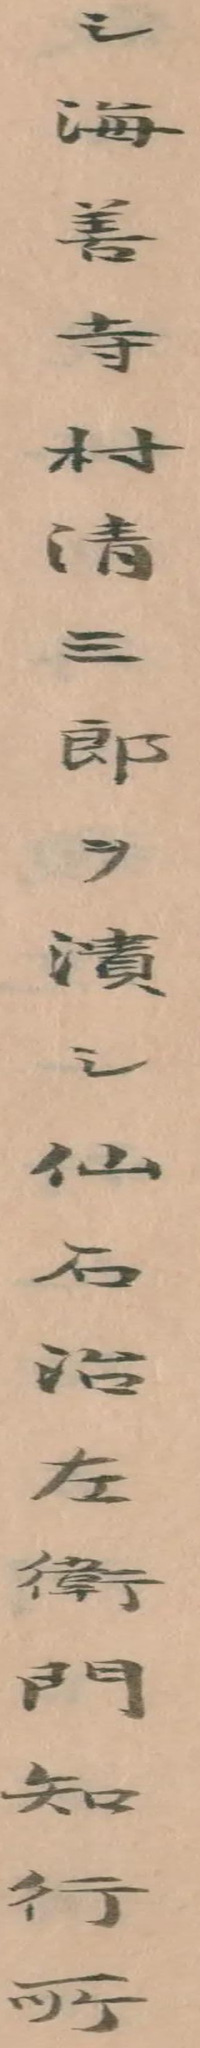シ海善寺村清三郎ヲ潰シ仙石治左衛門知行所
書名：地災撮要. 巻3(地震之部)-巻4(噴火之部)
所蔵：国立国会図書館 National Diet Library, JAPAN
